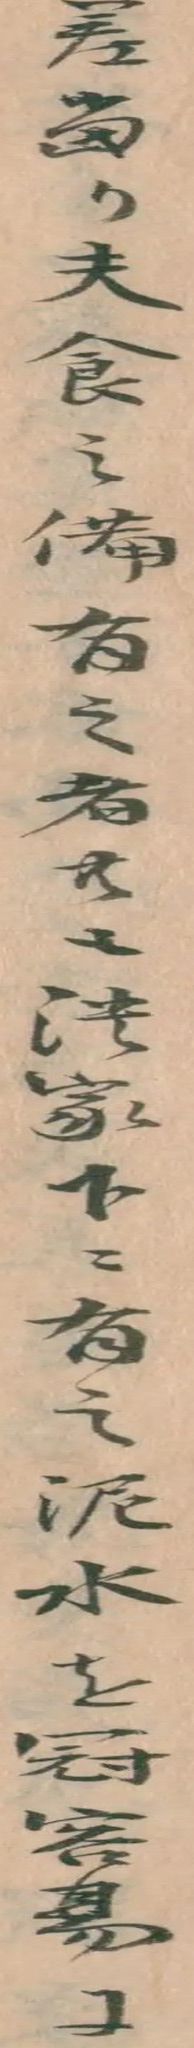差当り夫食之備有之者共も潰家下ニ有之泥水を冠り容易に

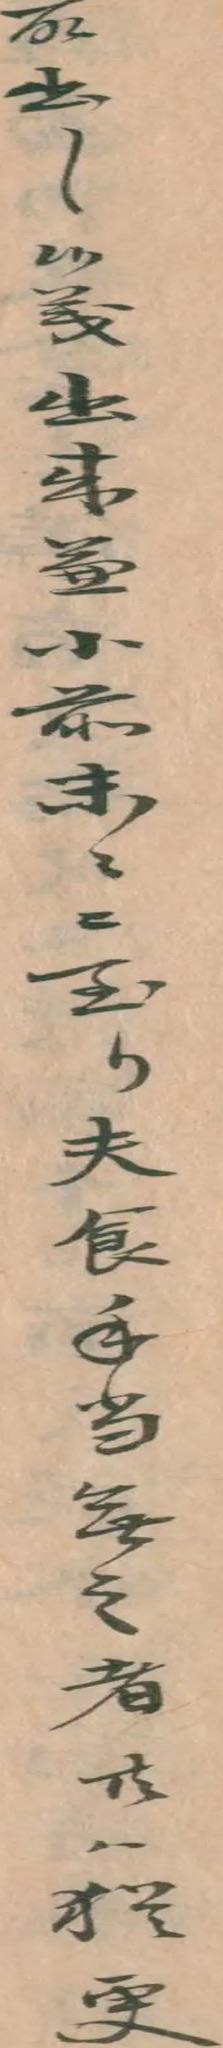取出候儀出来兼小前未々ニ至り夫食手当無之者共ハ猶更
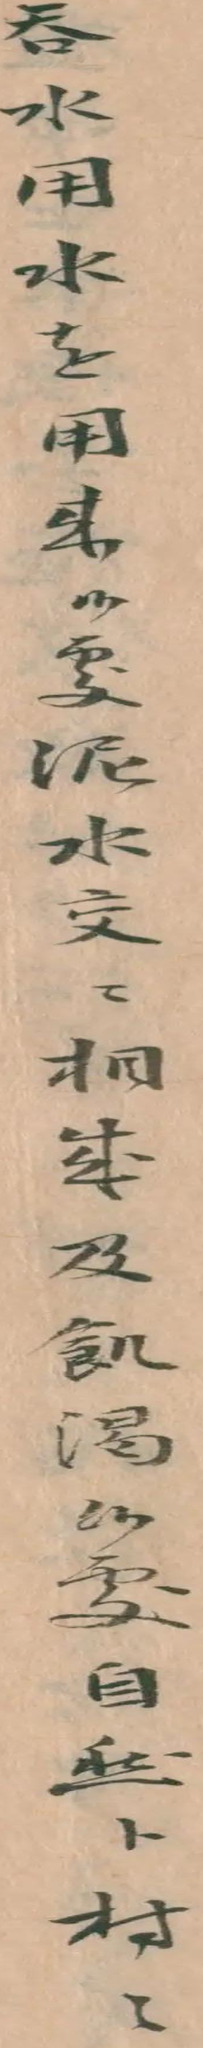呑水用水を用来候処泥水交ニ相成及飢餲候処自然ト村々
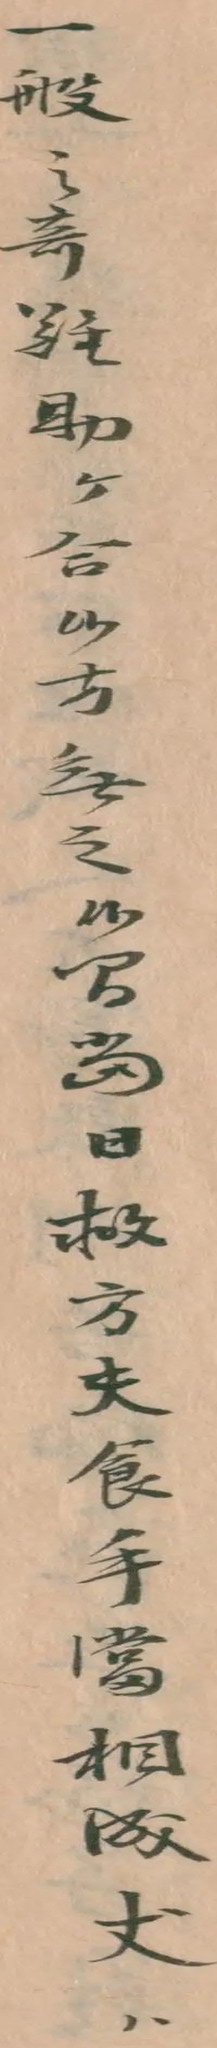一般之奇難助合候方無之候間当日救方夫食手当相成丈ハ
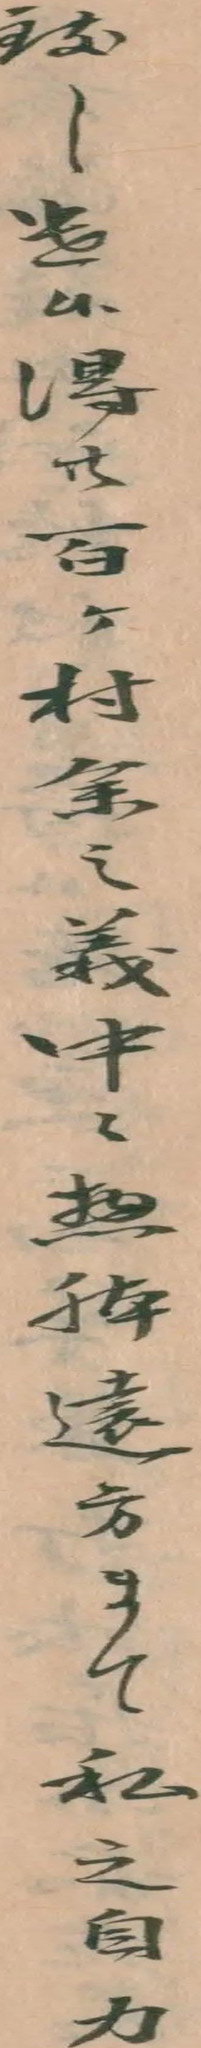致し遣候得共百ケ村余之義中々惣躰遠方にて私之自力
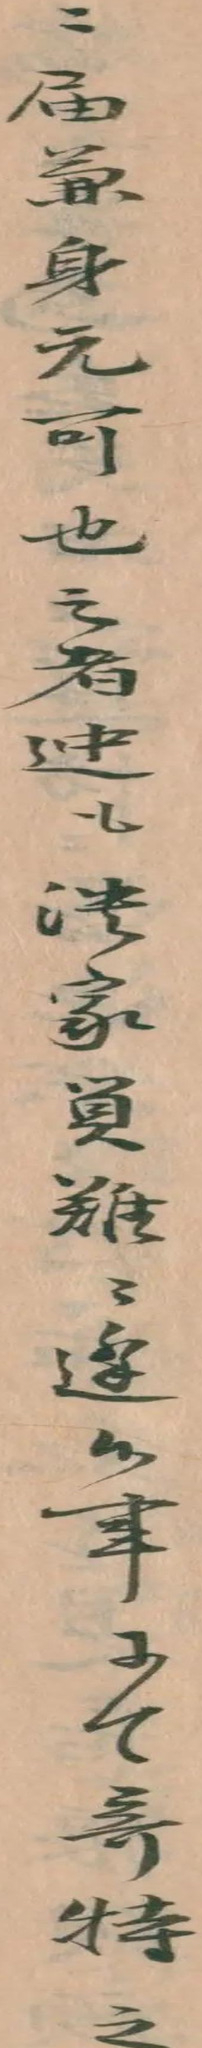ニ届兼身元可也之者迚も潰家災難ニ逢候事にて奇特之
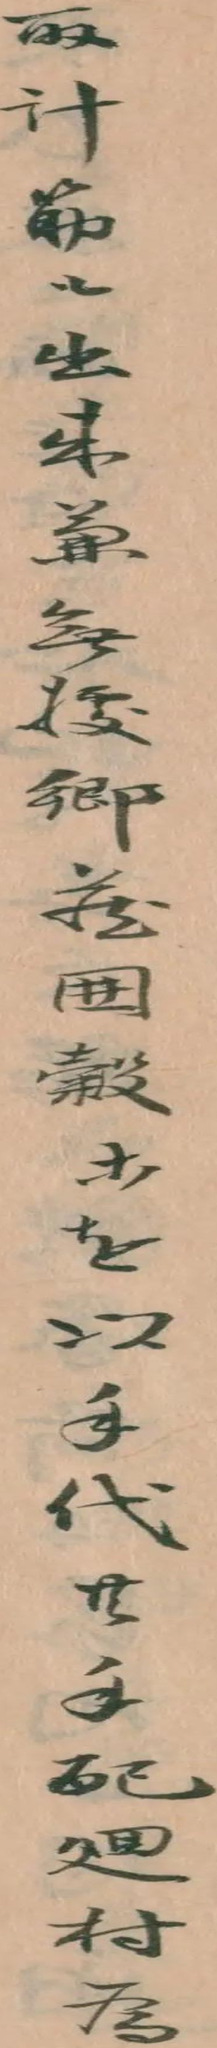取斗筋も出来兼無拠郷蔵囲穀等を以手代共手配廻村為
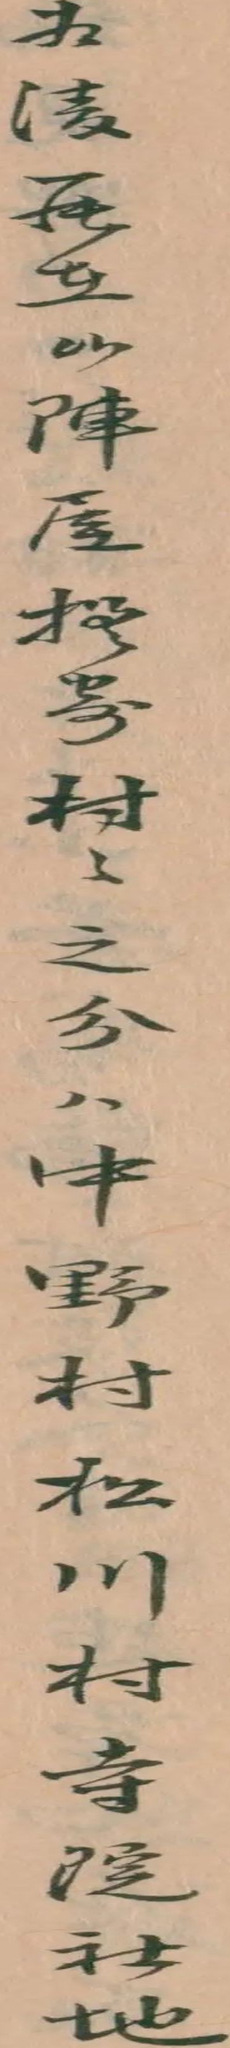相凌罷在候陣屋最寄り村々之分ハ中野村松川村寺院社地
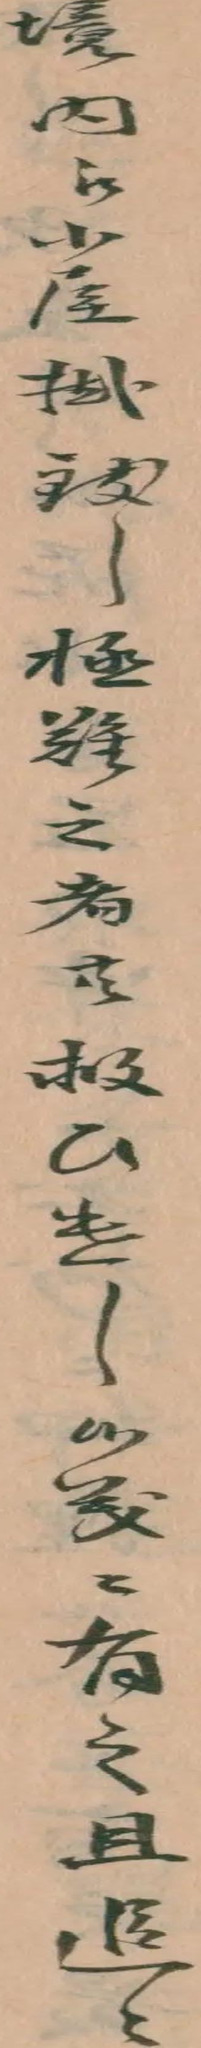境内江小屋掛致し極難之者共救遣し候義ニ有之且追々
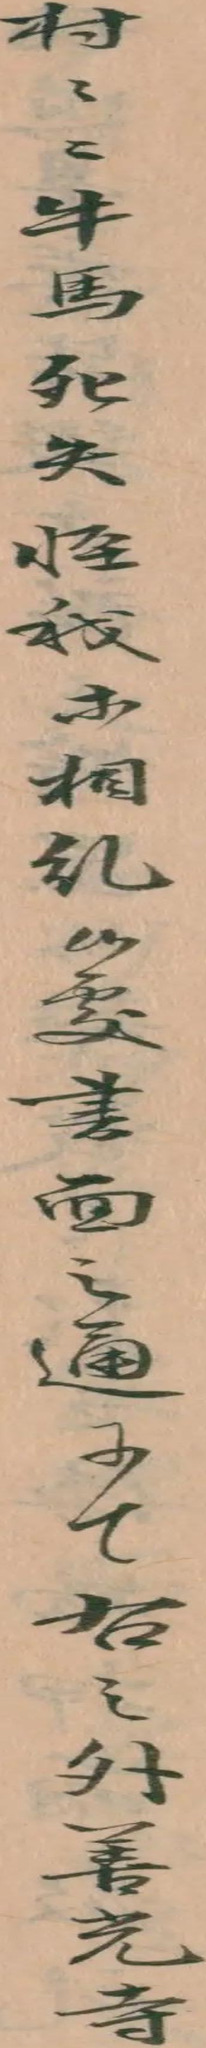村々二牛馬死失怪我等相糺候処書面之通にて右之外善光寺
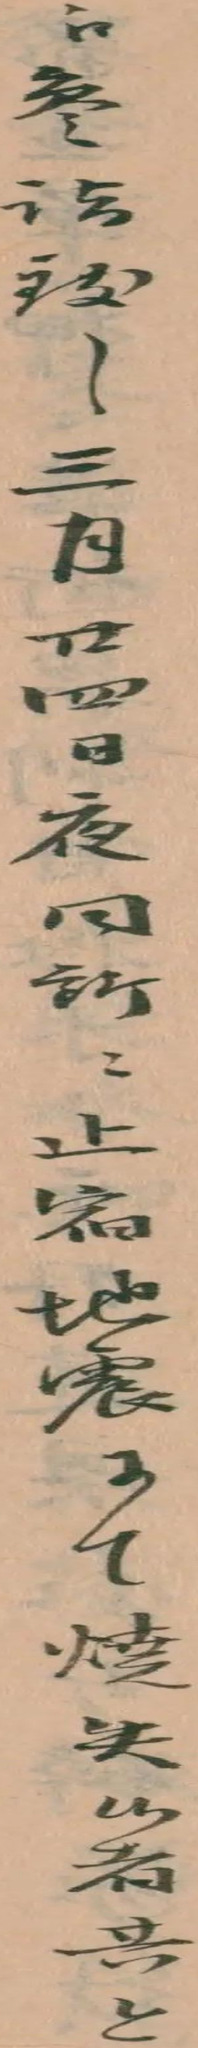参詣致し三月廿四日夜同所ニ止宿地震にて焼失候者と
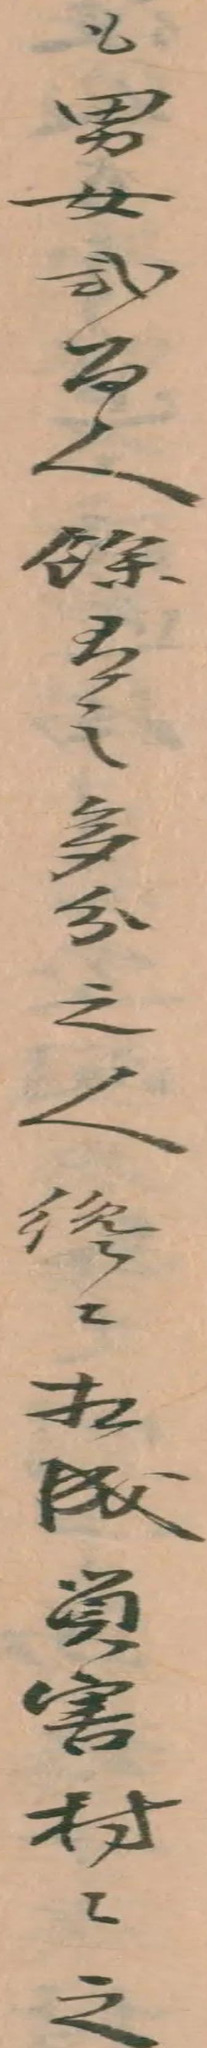も男女弐百人余有之多分之人絶ニ而相成災害村々之
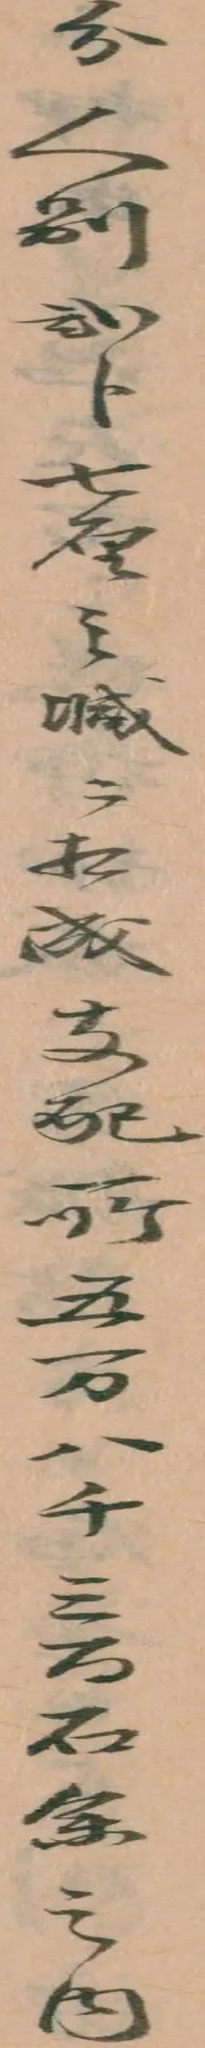分人別弐歩七厘之減ニ相成支配所五万八千三百石余之内
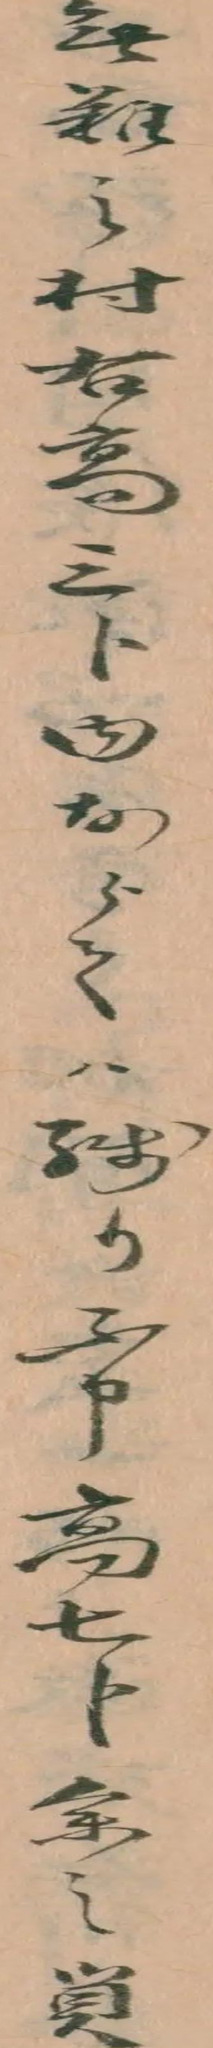無難之村右高三分内ならてハ残り不申高七分余之災
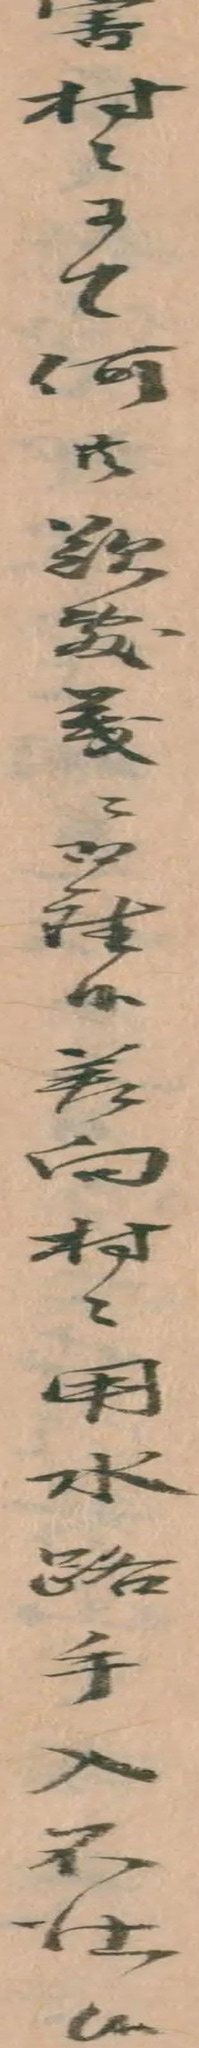害村々ニ而何共歎敷義ニ御座候差向村々用水路手入不仕候
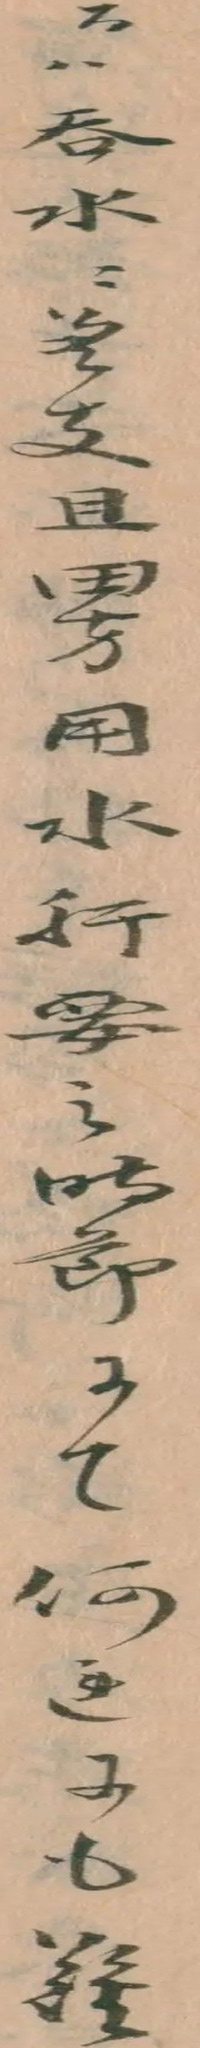而ハ呑水ニ差支且田方用水肝要之時節にて何れにも難
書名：地災撮要. 巻3(地震之部)-巻4(噴火之部)
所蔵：国立国会図書館 National Diet Library, JAPAN
